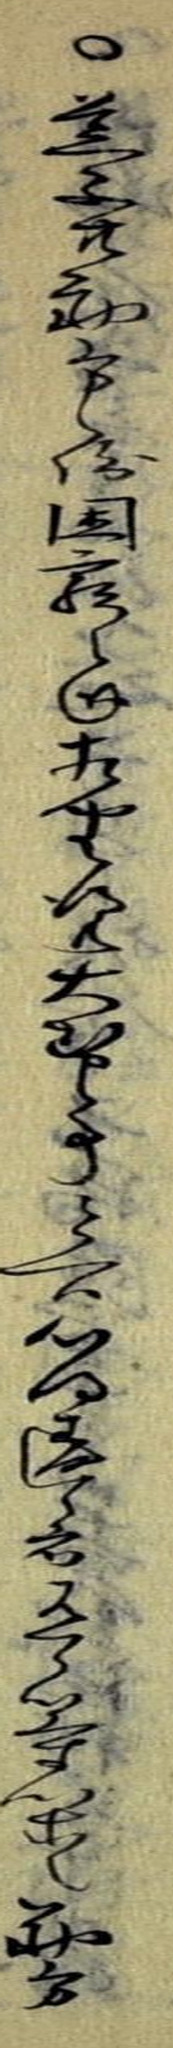○荒子共勤方之儀困窮之趣相聞候得共大勢之事ニ候へハ心得違之者有之等閑之勤方
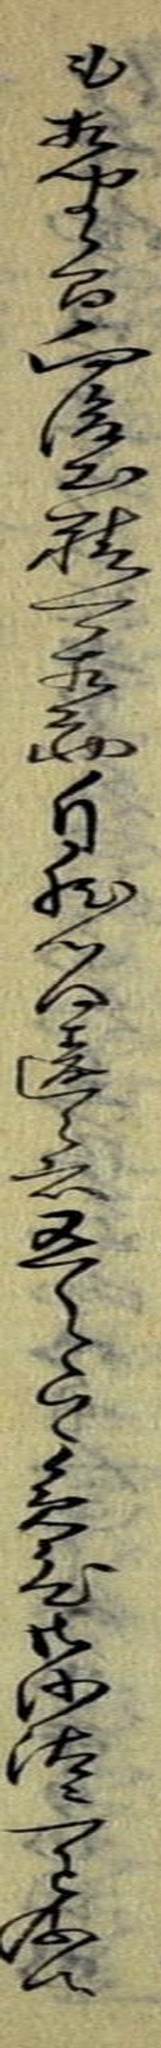も相聞候間向後出精可相勤自然心得違之者有之候ハヽ急度御沙汰ニ可被及候
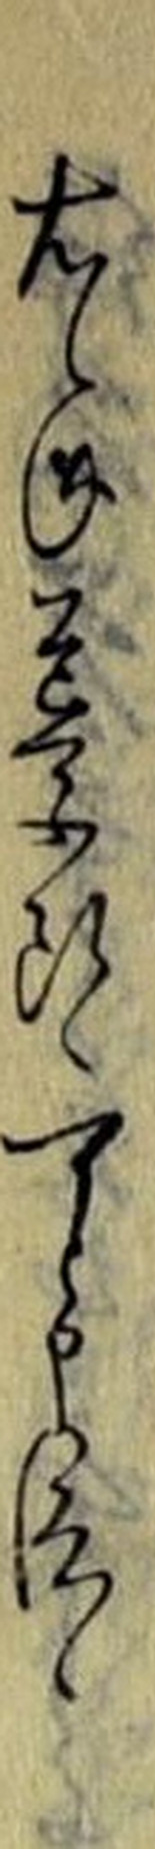右之趣荒子頭へ可被申渡候
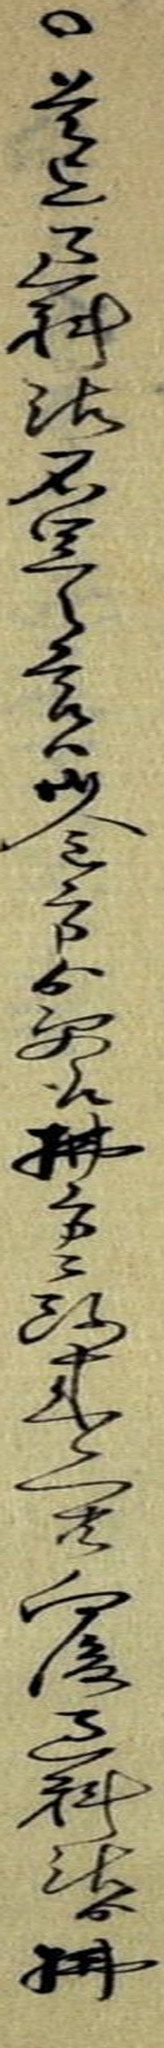○是迄過料銀不足之節ハ御金方ゟ受取払方ニ致来候へ共向後過料銀ゟ払
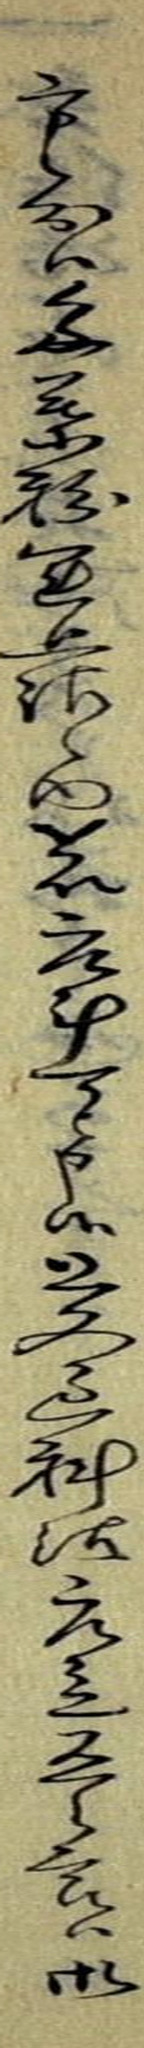方之分ハ多葉粉運上銀之内を以取計可被申候且又過料銀取立有之節ハ御
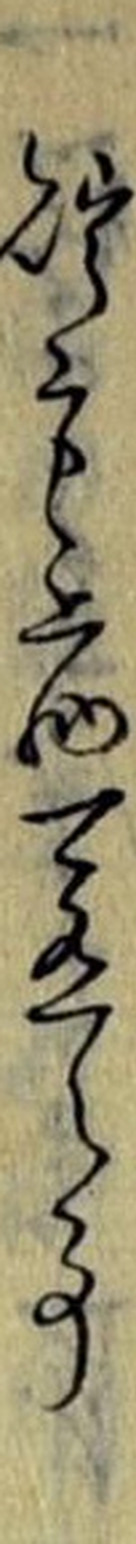貯方之上納可有之事
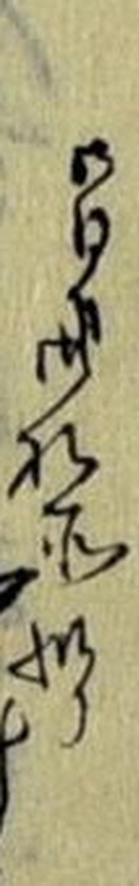御目付御札所掛り
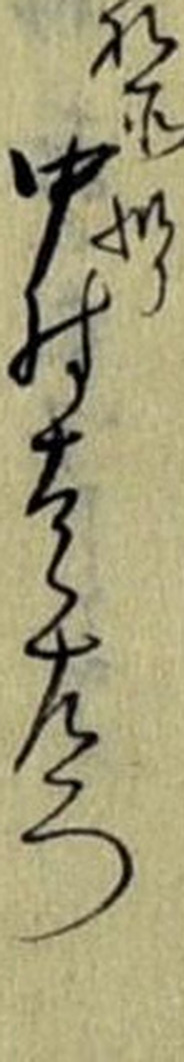中村太郎左衛門
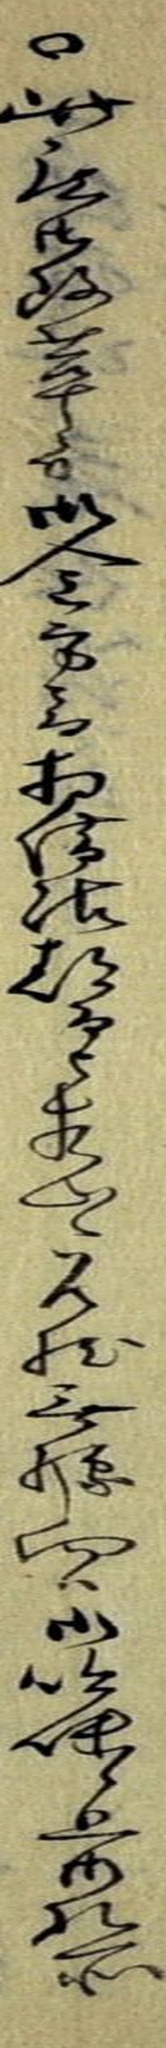○此度御改革ニ付御金方ニ而拝借銀都而相止候乍然無拠向ハ御吟味之上御札所
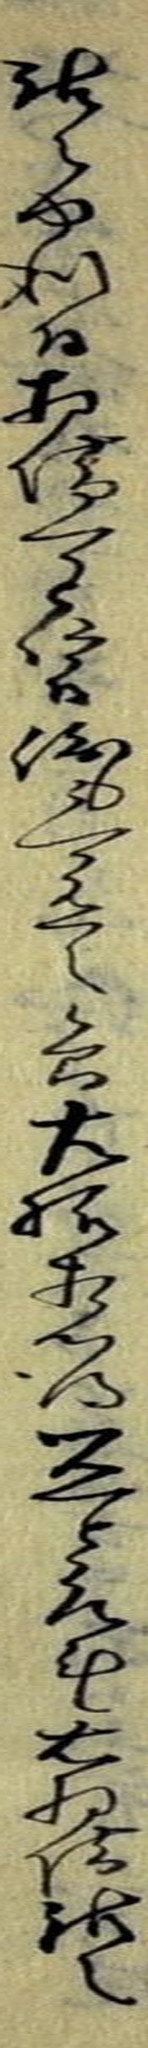銀之内利付拝借可被仰付儀も可有之候間左様相心得宜被取計候、右拝借銀之
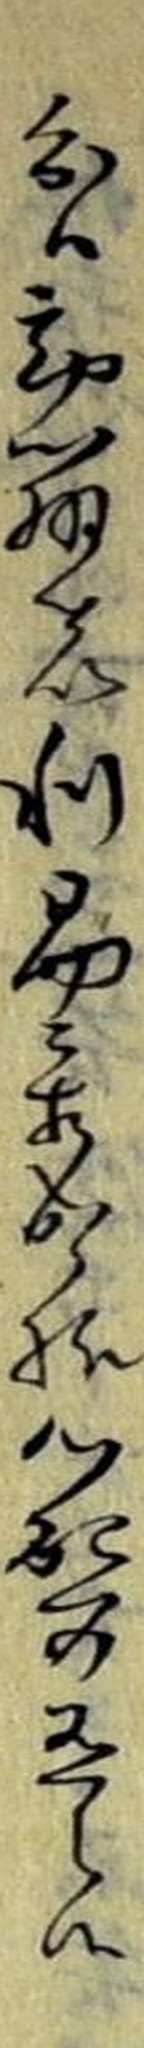分ハ勘弁を以利易ニ相成候様心配可有之候
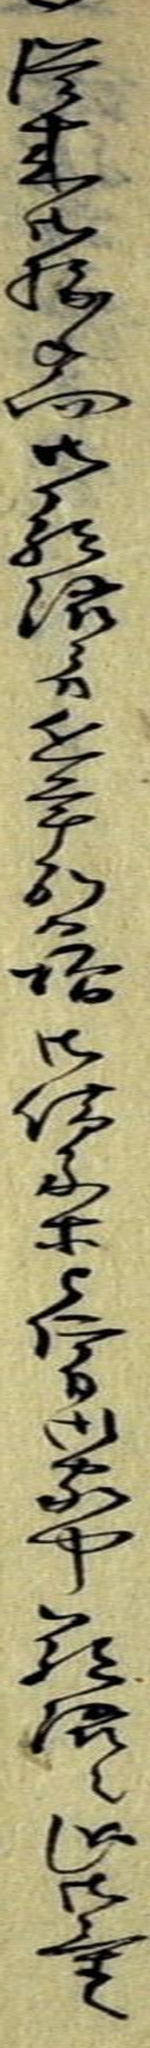○従来御勝手向御難渋ニ付近年別而増御借米被仰付御家中難渋之趣御気之
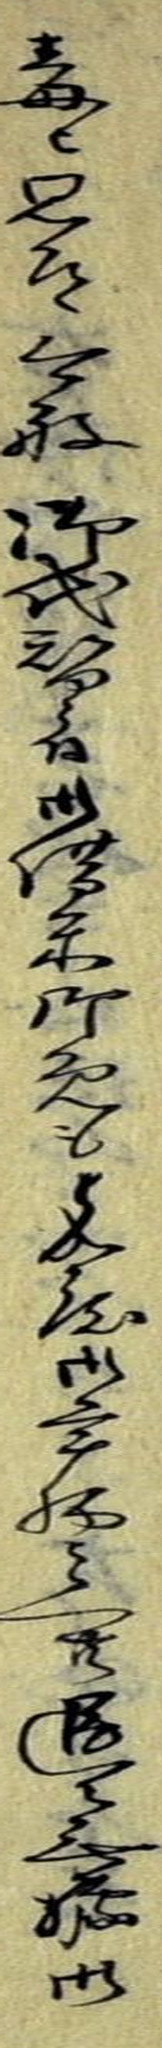毒被思召候今般御代替ニ付御借米御免も被成度御年柄ニ候へ共追々無拠御
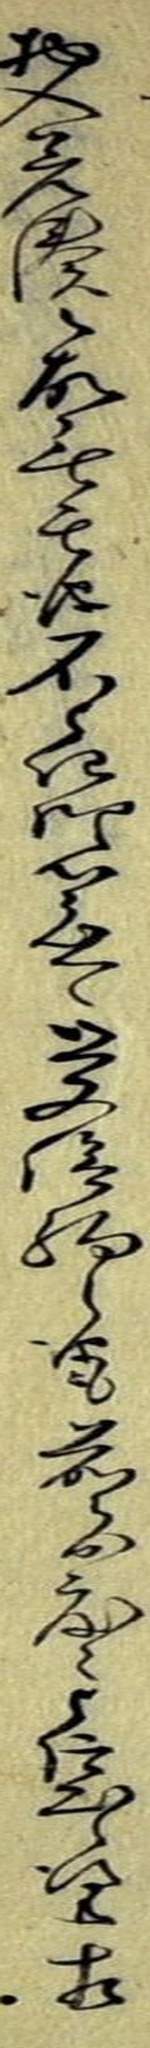物入差湊候故無其儀不被任御心底候且又倹約之儀も前々ゟ度々被仰付候得共相
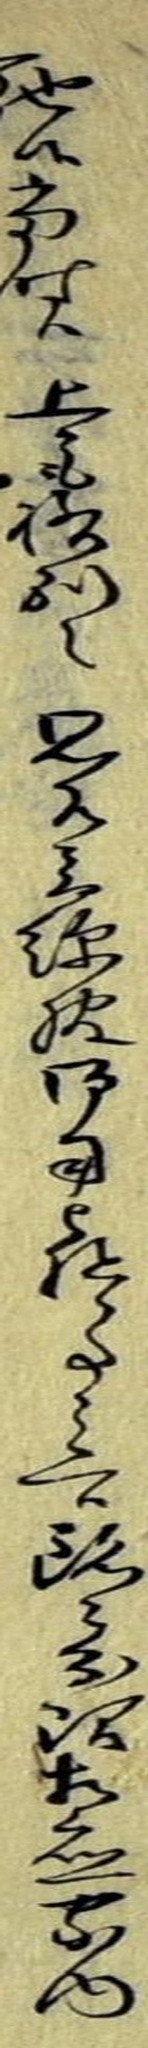弛候当時は上ニも格別之思召ニ而綿服御用被遊候事ニ候へハ銘々分銀相応家内
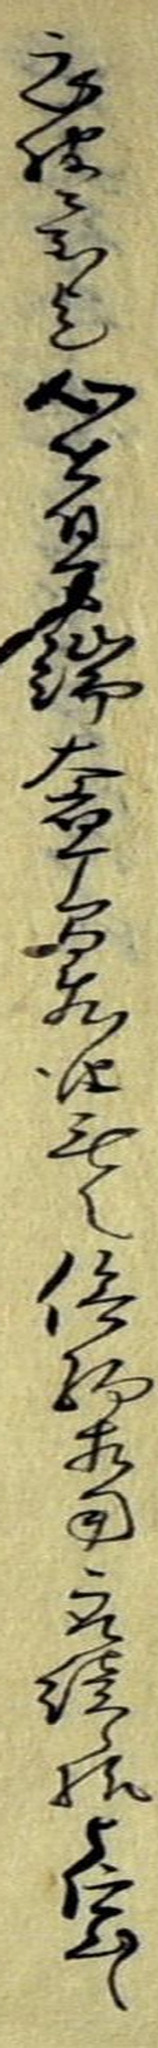衣服ニ至迄心を付万端奢ケ間敷儀無之倹約相用取続候様被仰付候
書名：命令之部 五
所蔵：福井県文書館 Fukui Prefectural Archives
